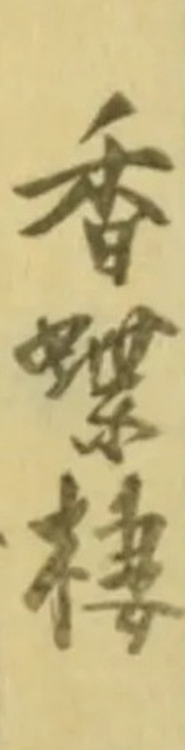香蝶棲
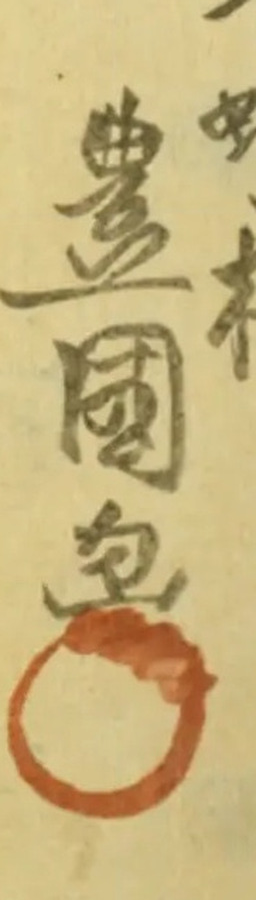豊国画
